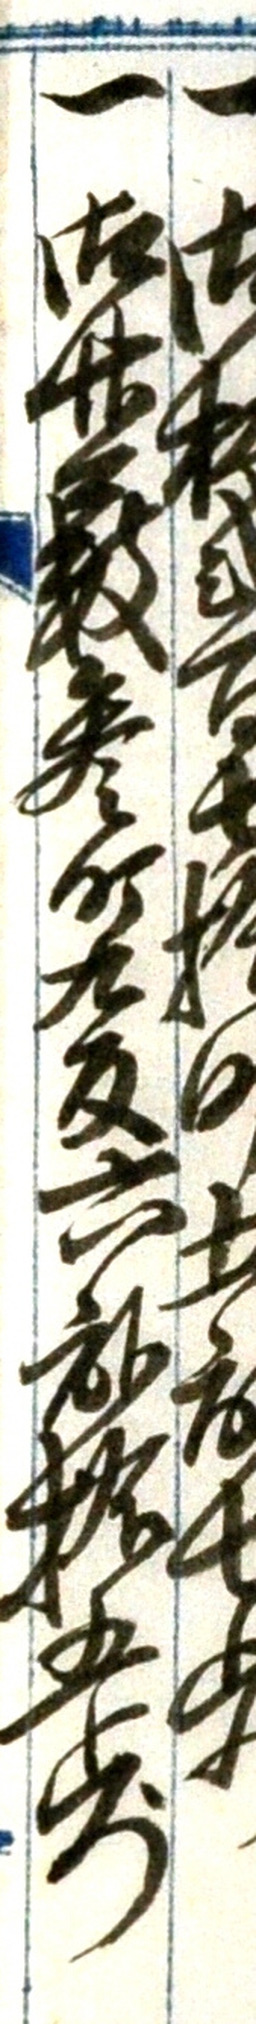一御竹藪参町九反六畝拾五歩

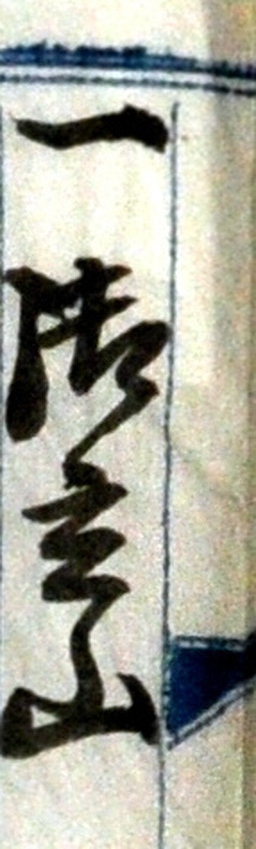一御立山
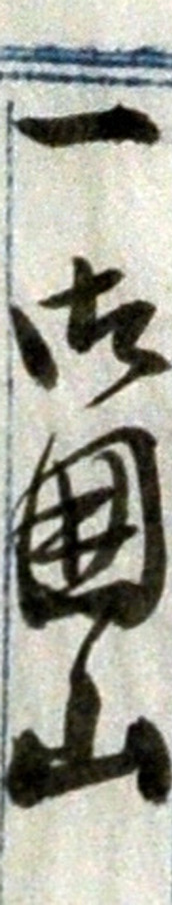一御囲山
